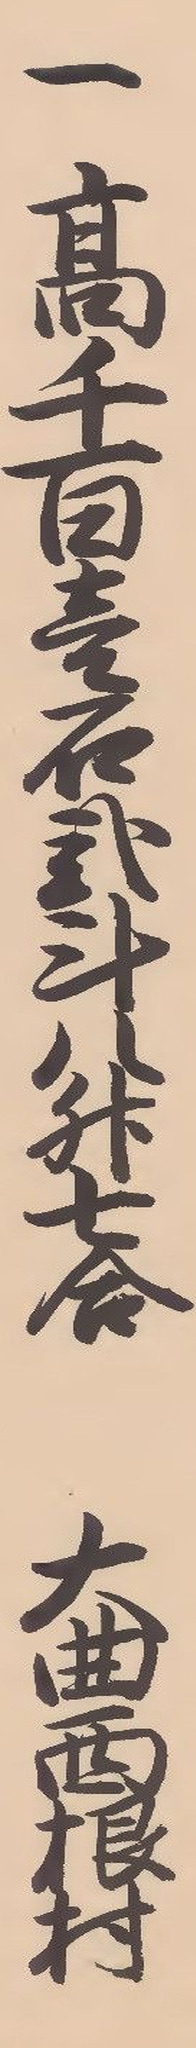一高千百壱石弐斗八升七合大曲西根村
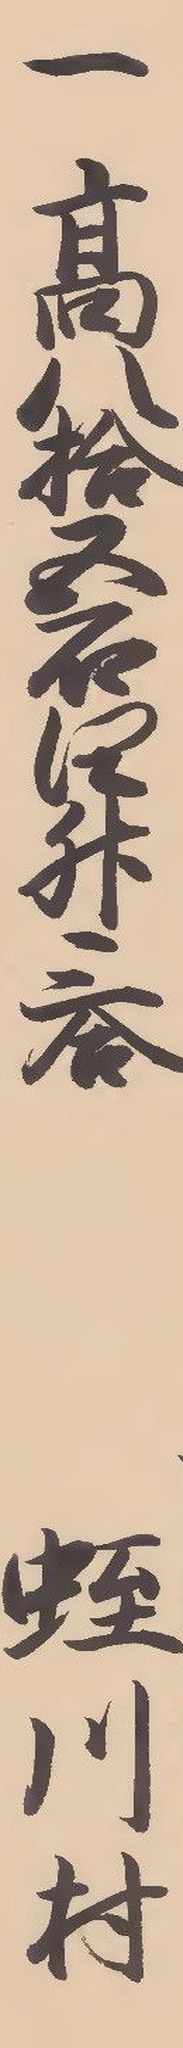一高八拾五石四升三合蛭川村
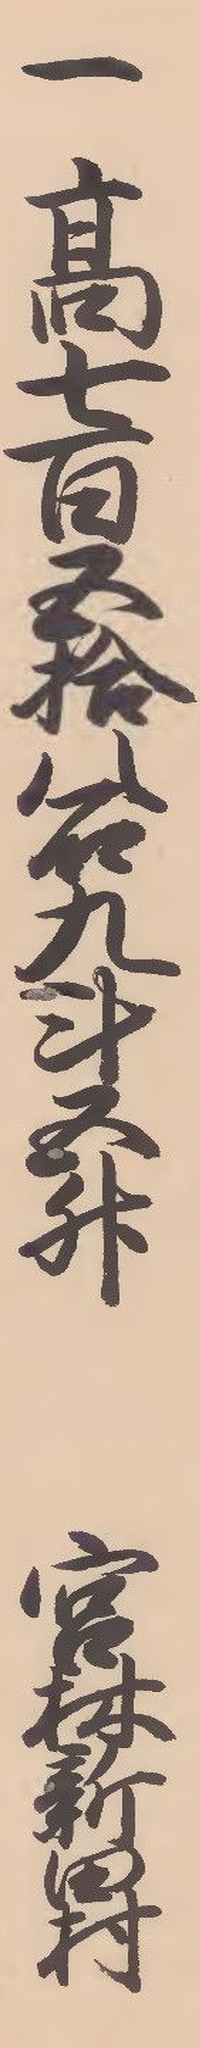一高七百五拾石九斗五升宮林新田村

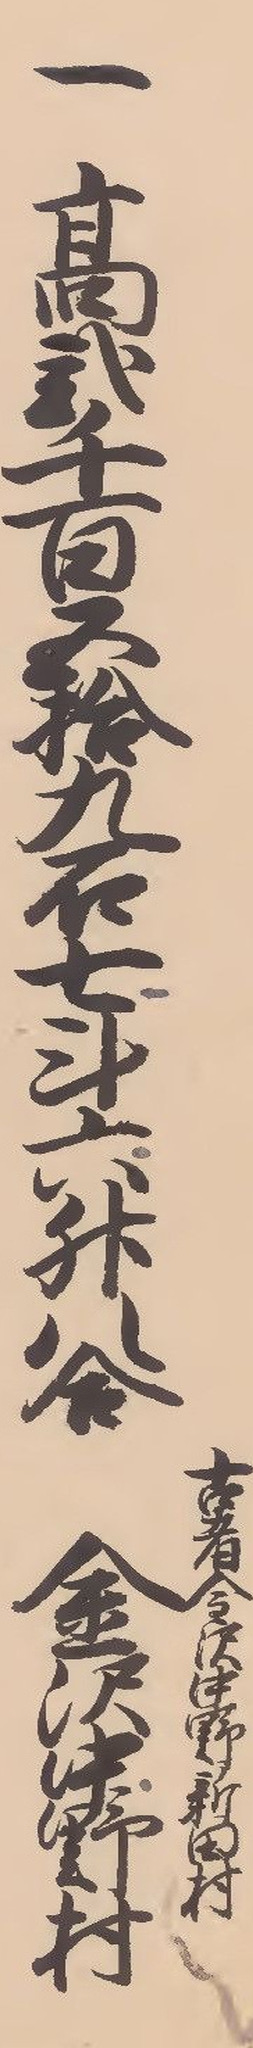一高弐千百五拾九石七斗六升八合金沢中野村
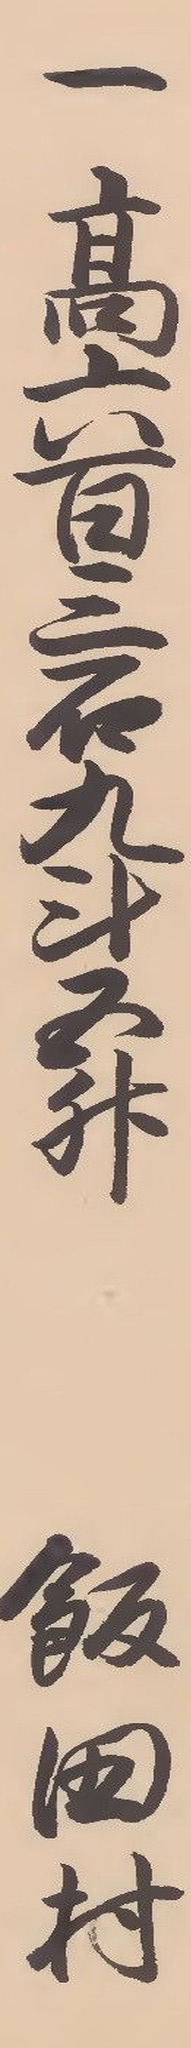一高六百三石九斗五升飯田村
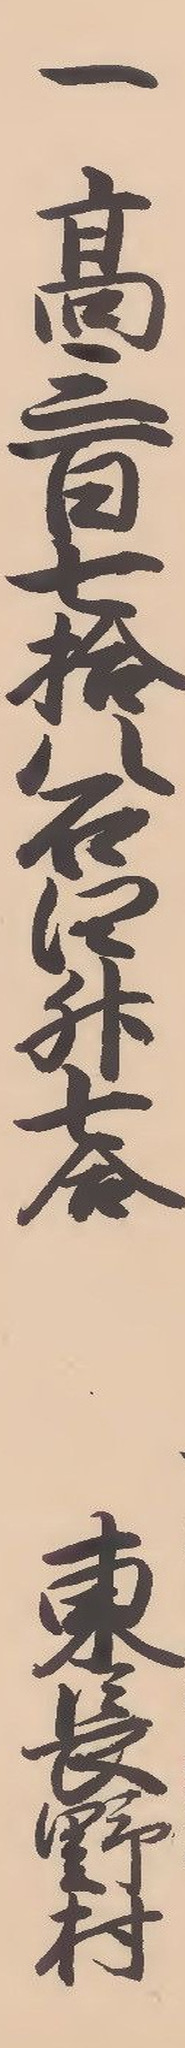一高三百七拾八石四升七合東長野村
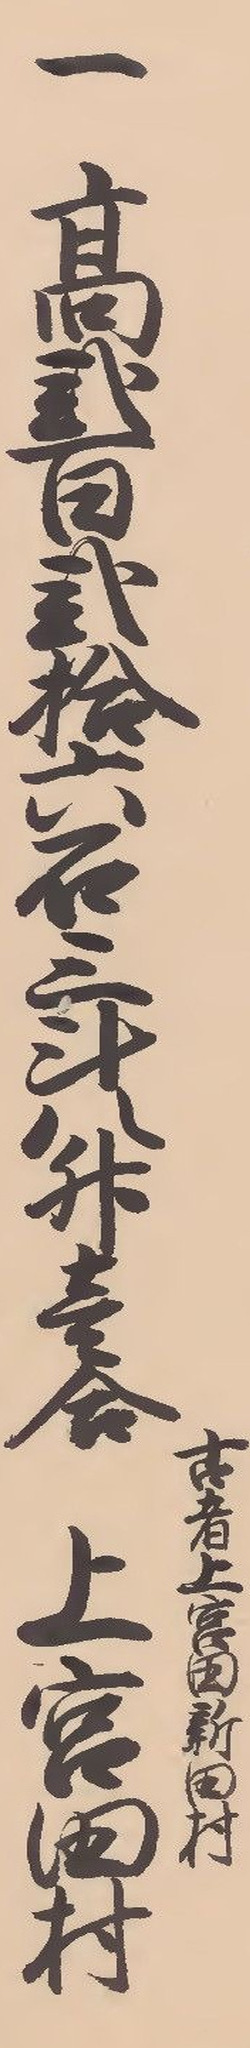一高弐百弐拾六石三斗八升壱合上宮田村
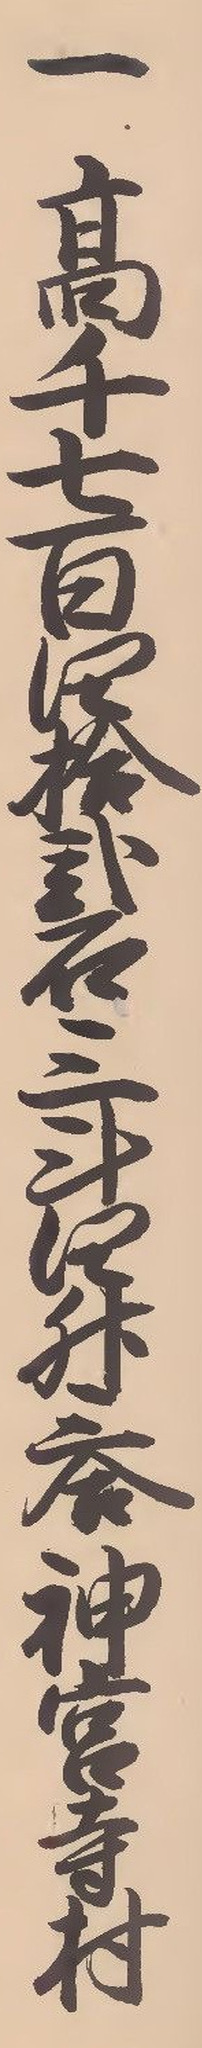一高千七百四拾弐石三斗四升三合神宮寺村
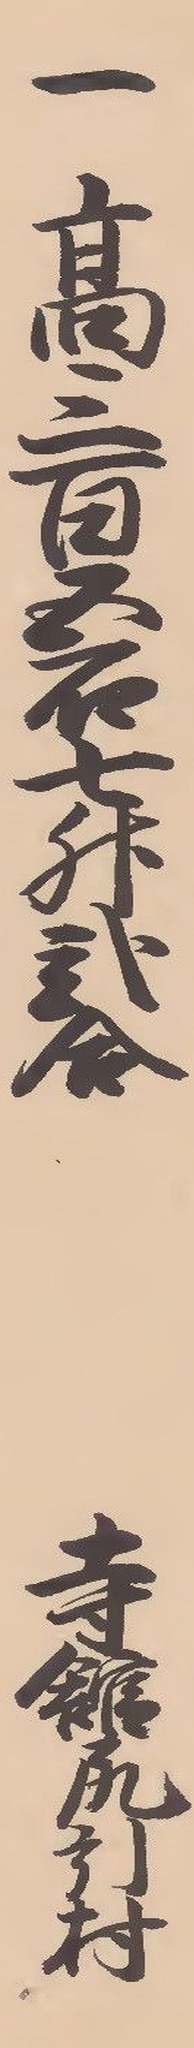一高三百五石七升弐合寺館尻引村
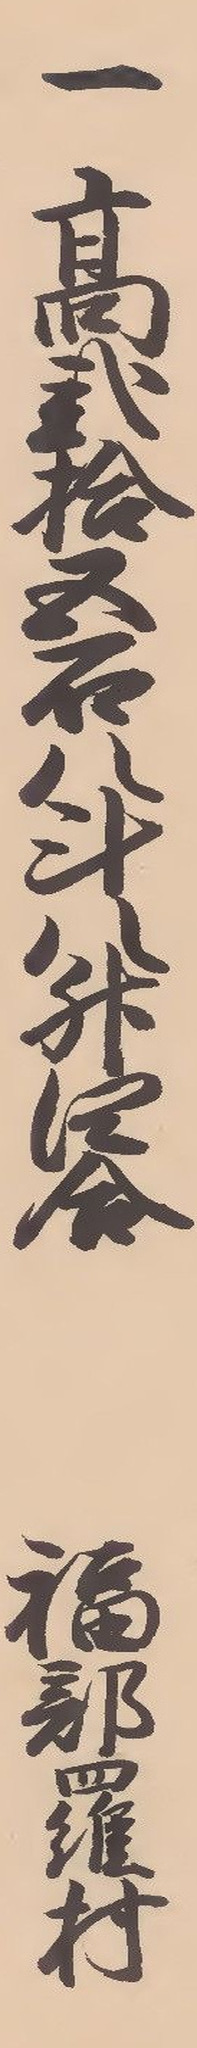一高弐拾五石八斗八升四合福部羅村
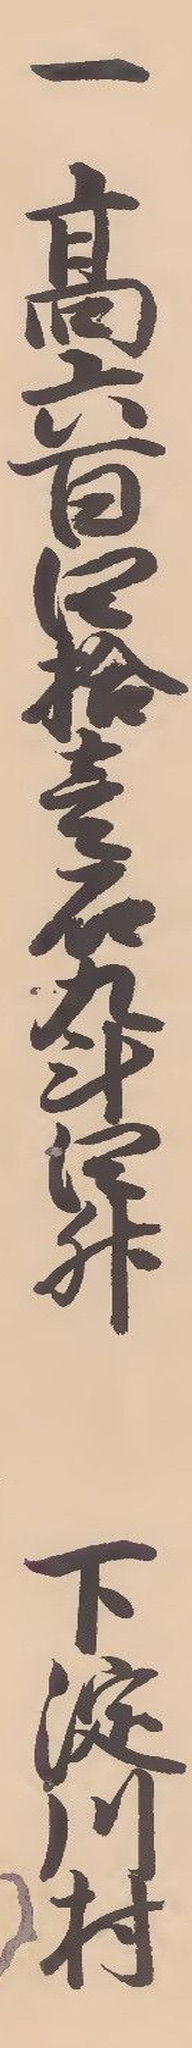一高六百四拾壱石九斗四升下淀川村

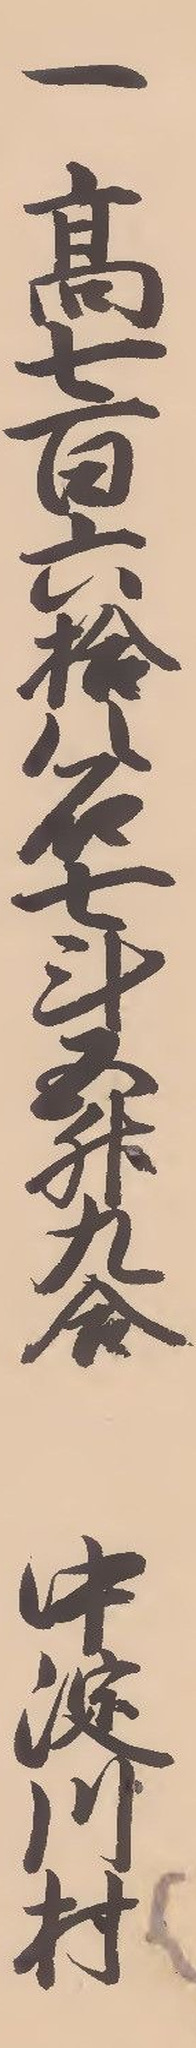一高七百六拾八石七斗五升九合中淀川村
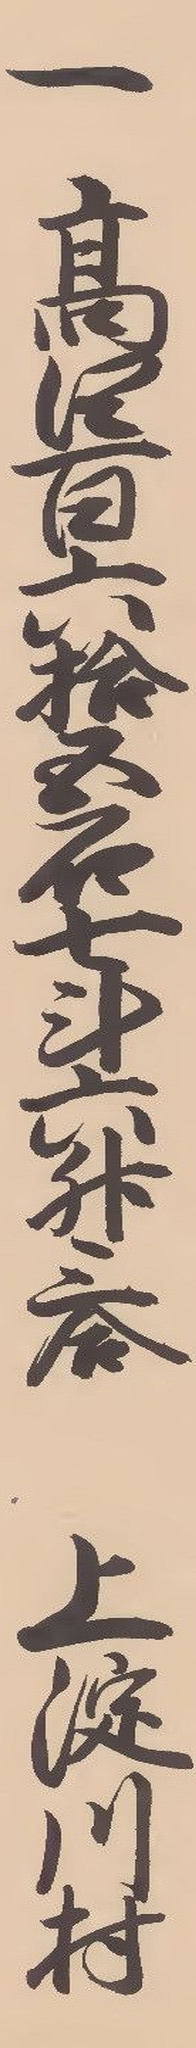一高四百六拾五石七斗六升三合上淀川村
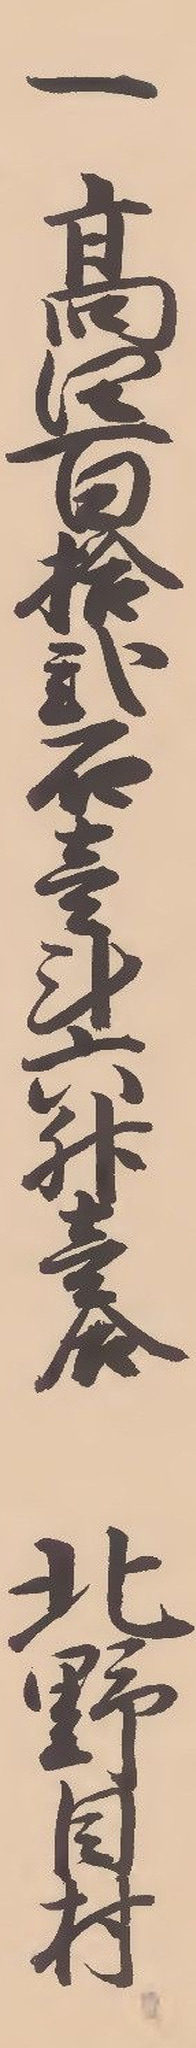一高四百拾弐石壱斗六升壱合北野目村
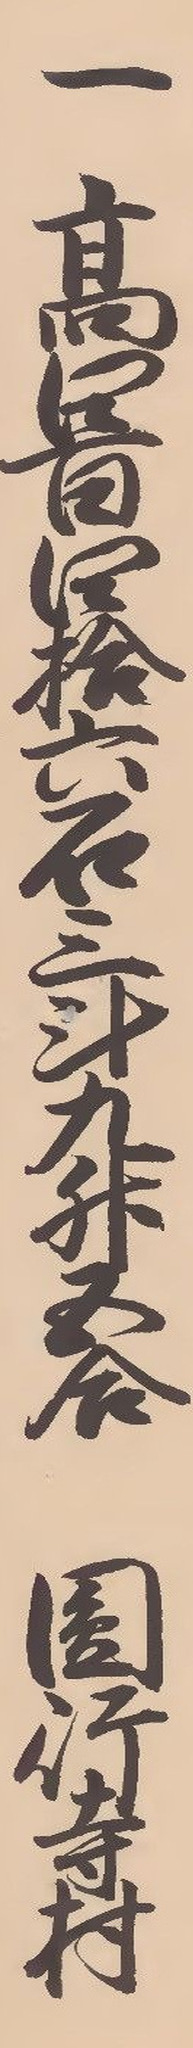一高四百四拾六石三弐九升五合円行寺村
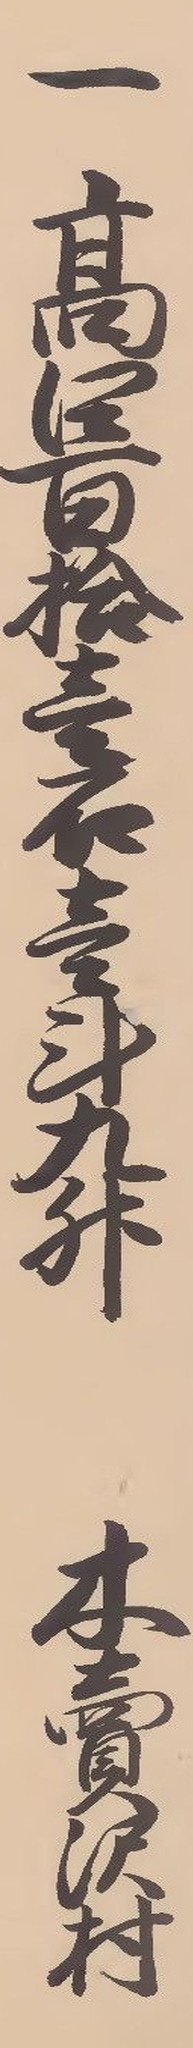一高四百拾壱石壱斗九升木売沢村
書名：出羽国郷帳　５
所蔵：国立公文書館 National Archives of Japan
